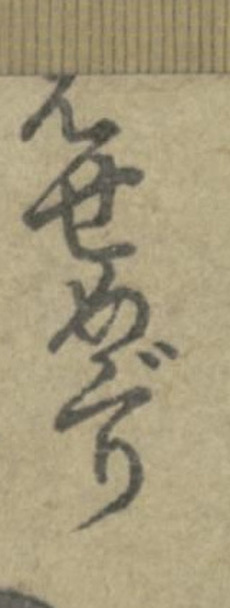はせめぐり
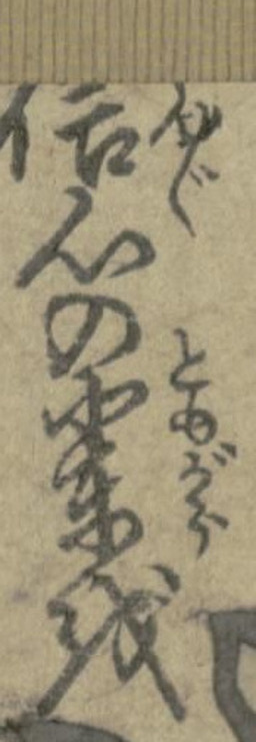信心の輩を
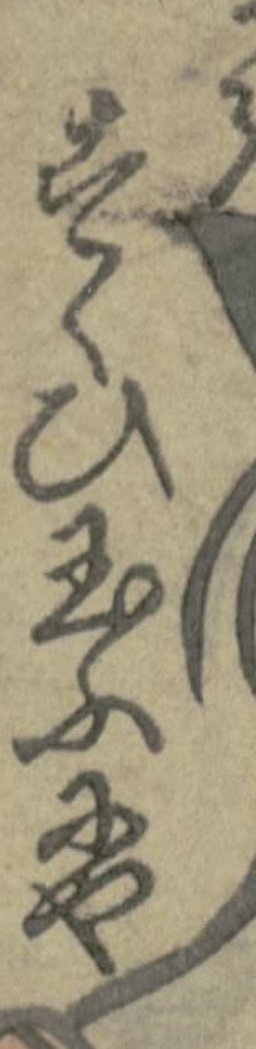すくひ玉ふにや
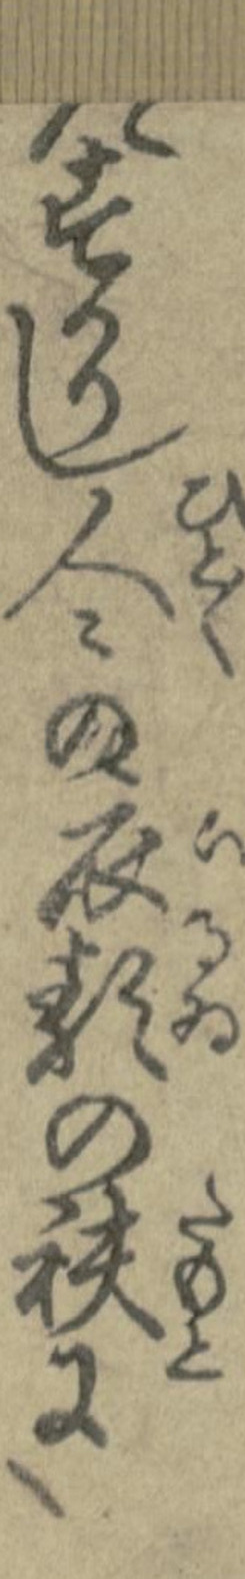たすかりし人〻の衣類の袂に
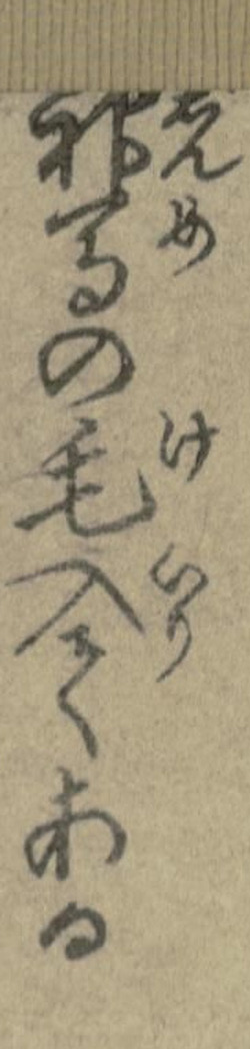神馬の毛入てある
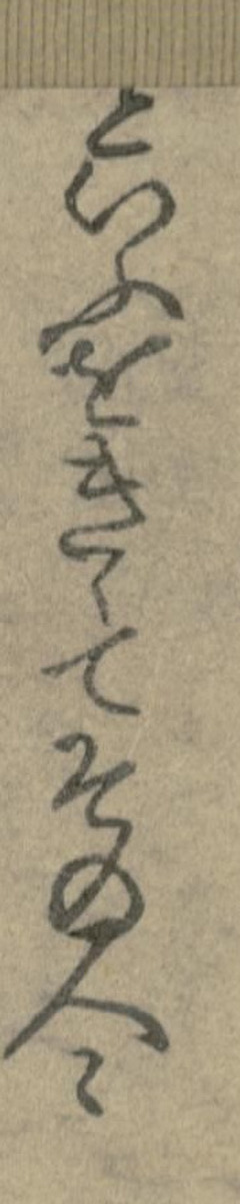といふをきゝてその人〻
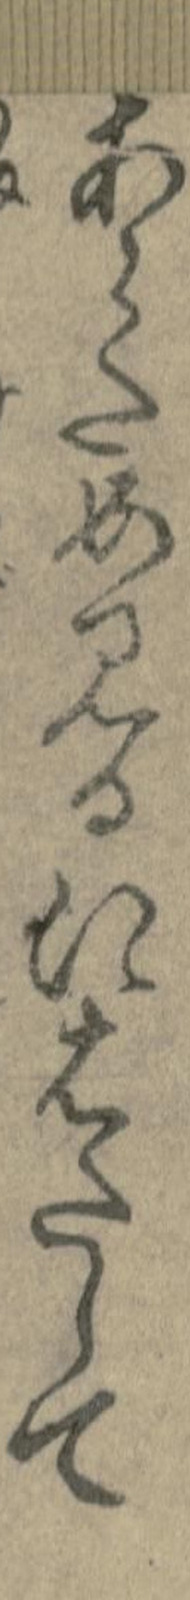あらため見るにはたして
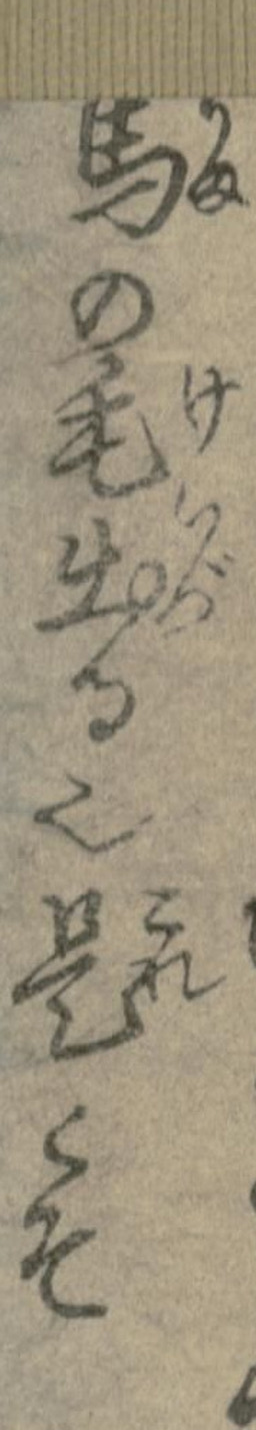馬の毛出る也是こそ
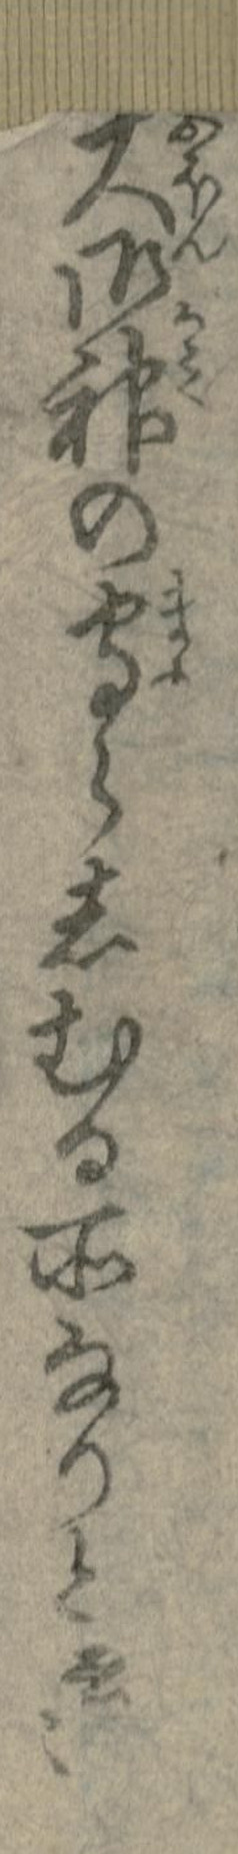大御神の守らしむる所なりと云々
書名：[伊勢の馬を引く鹿島大明神]
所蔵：東京大学地震研究所図書室 Earthquake Research Institute Library, The University of Tokyo, JAPAN
